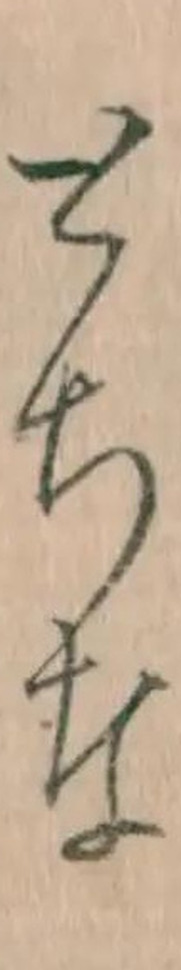とちな
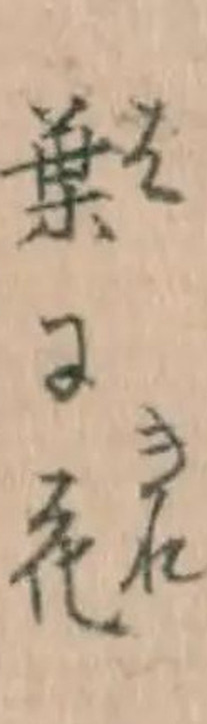葉に花
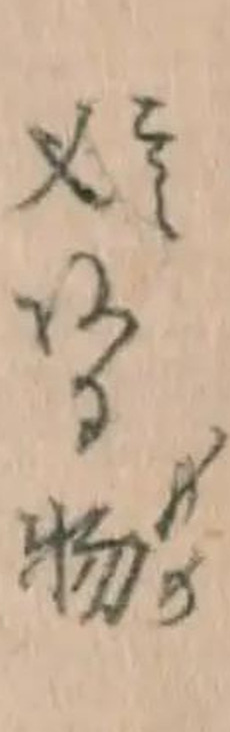叉ある物

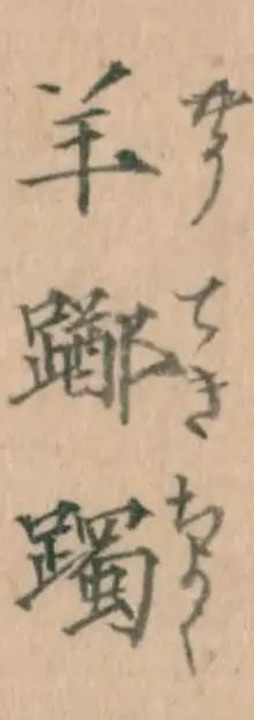羊躑躅
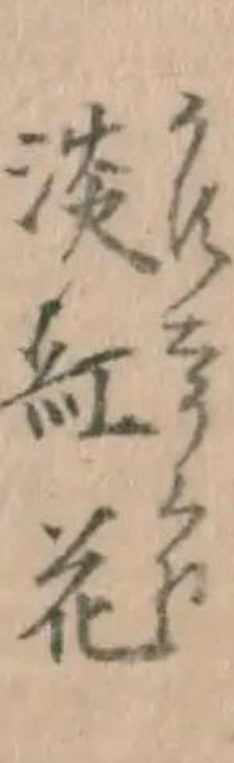淡紅花

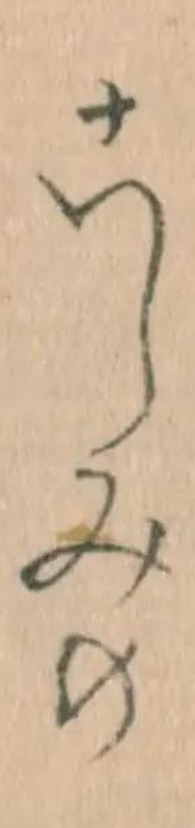こしみの
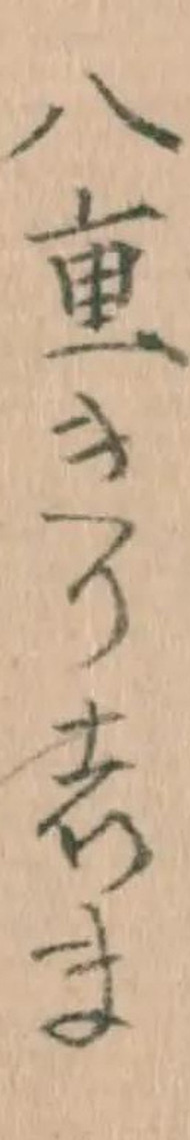八重きりしま
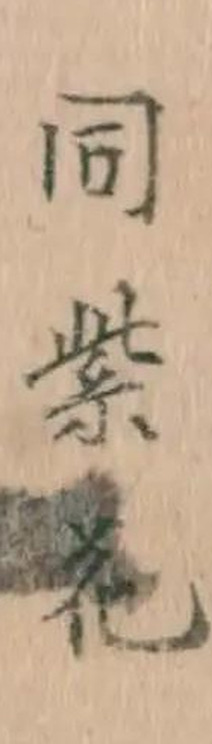同紫花
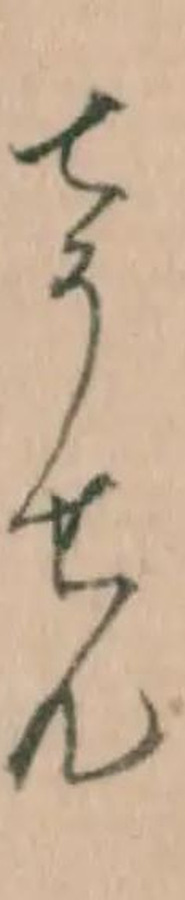てうせん

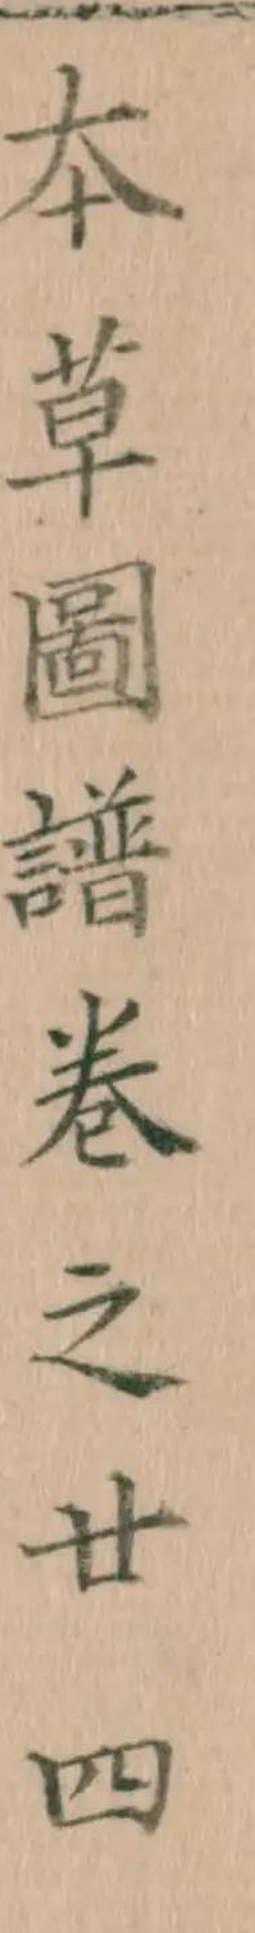本草図譜巻之廿四
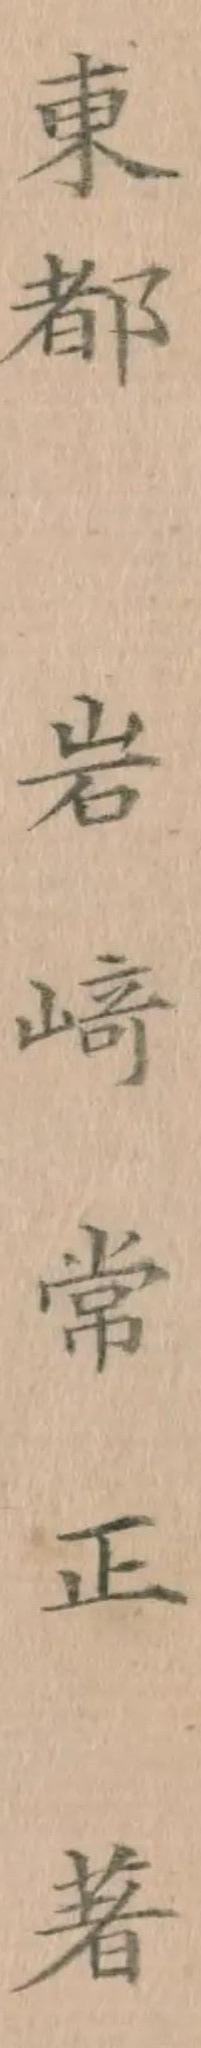東都岩崎常正著
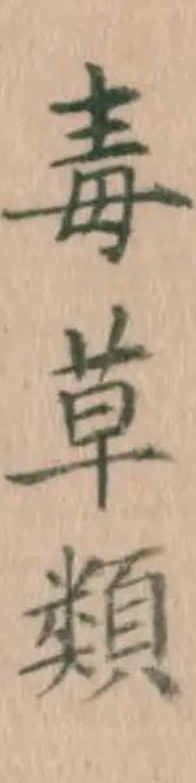毒草類

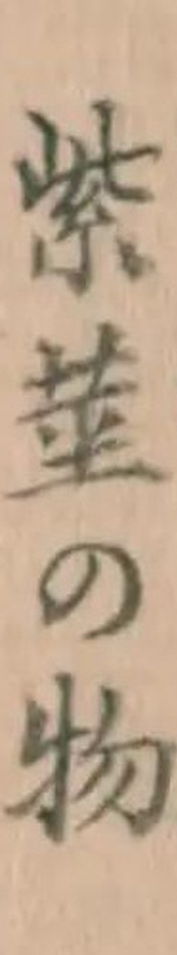紫茎の物

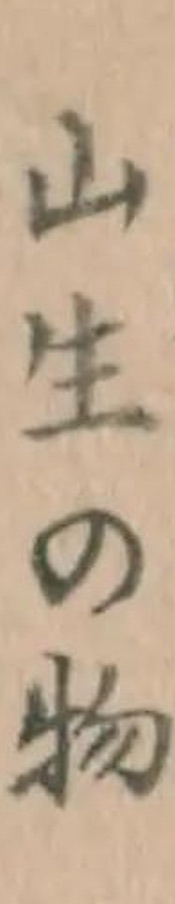山生の物
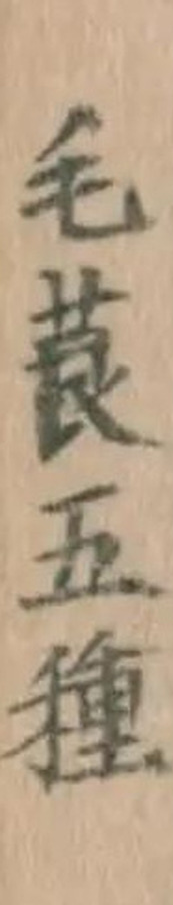毛茛五種

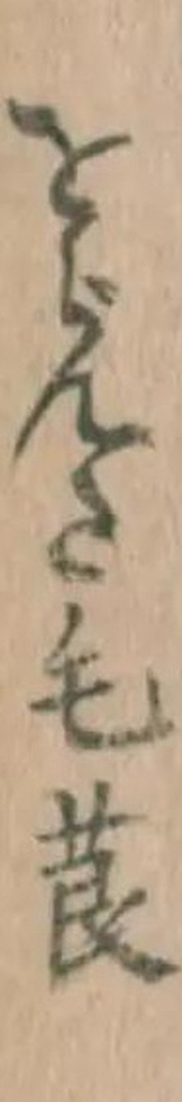をらんた毛茛
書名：本草図譜. 巻22-24
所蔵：国立国会図書館 National Diet Library, JAPAN
